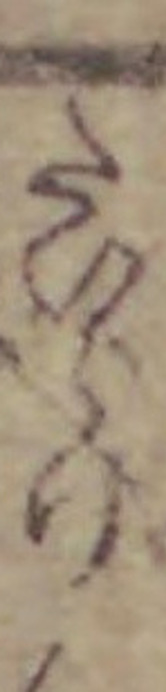たいらげ
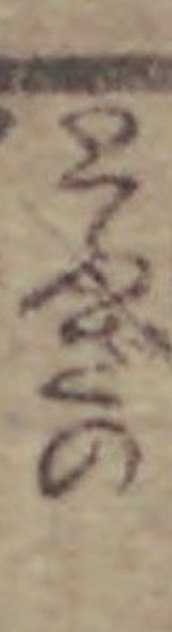とふざの
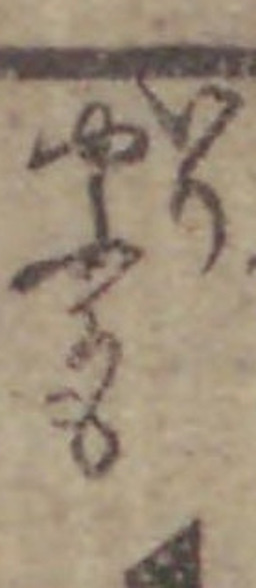やふにも
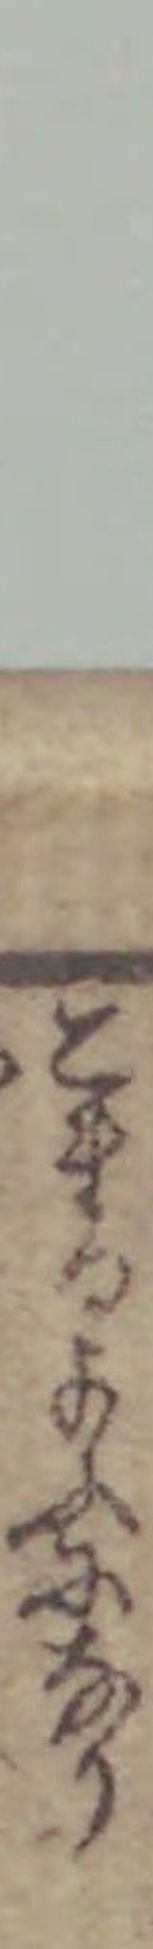こまるよふになり
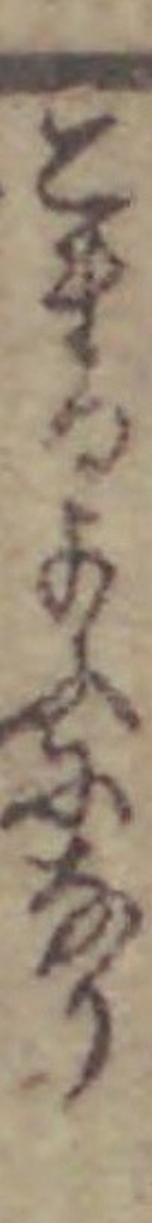こまるよふになり
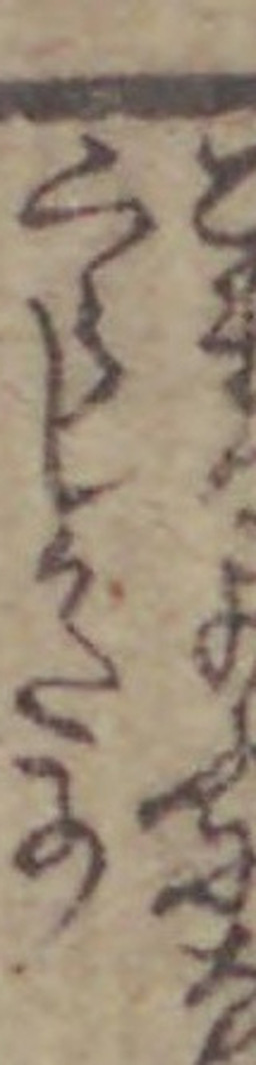くらしかたに
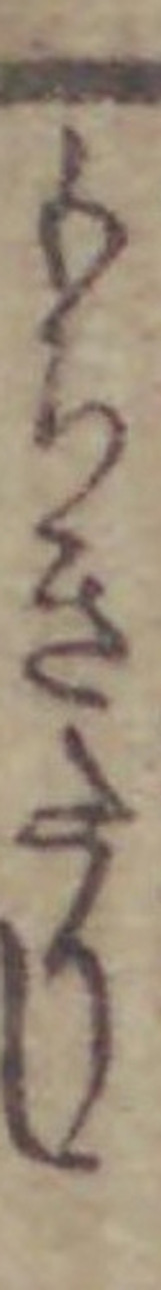もちきたりし
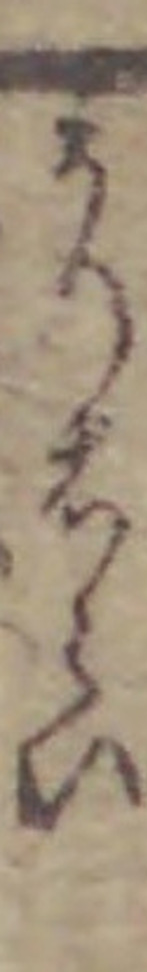うりはらい
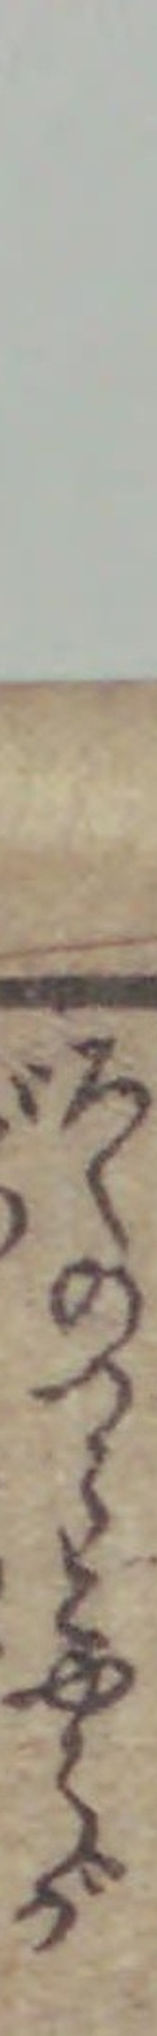ろくのつらとやらが
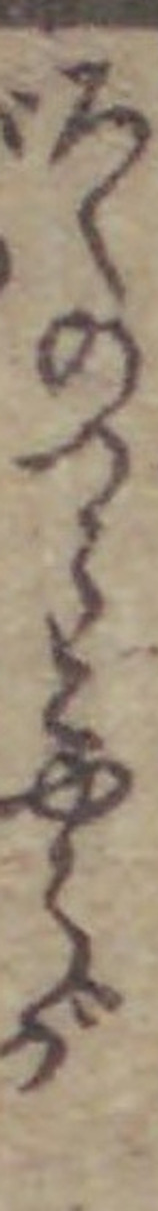ろくのつらとやらが
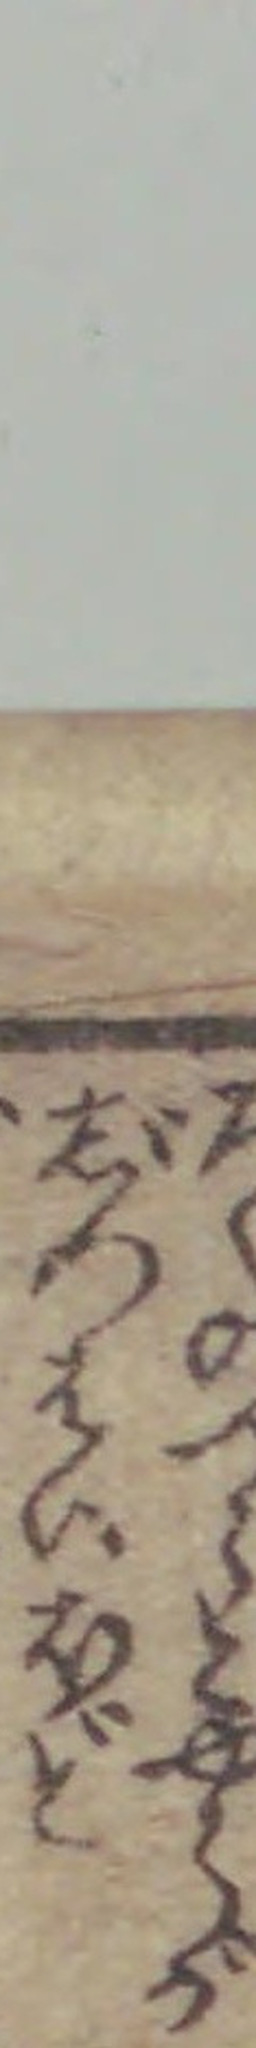じつはいほど
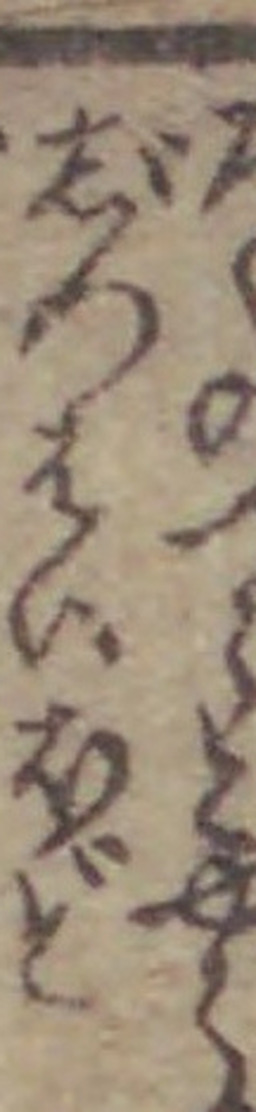じつはいほど
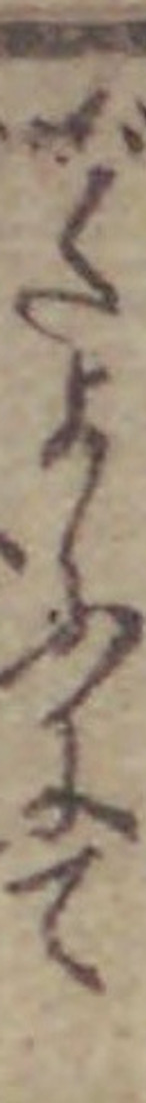たよふにて
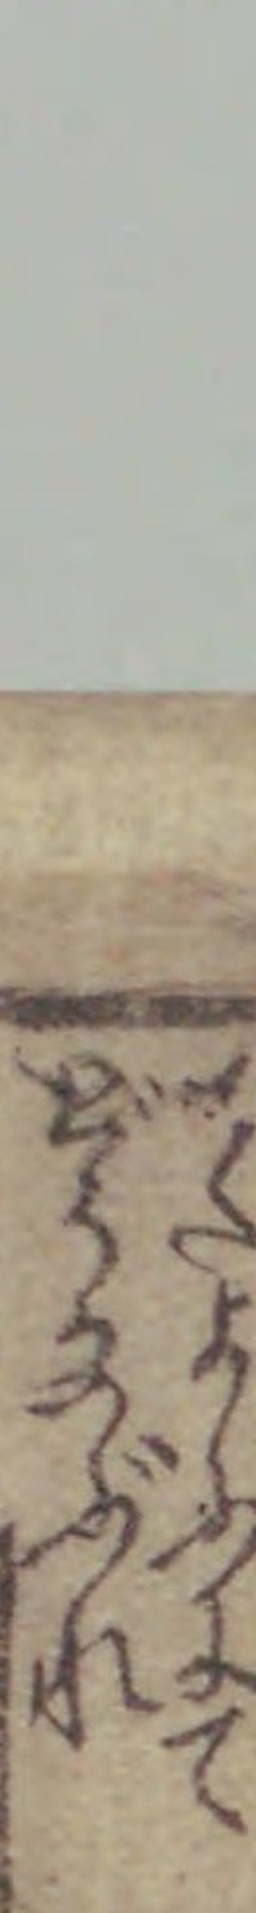どう文ぶれ
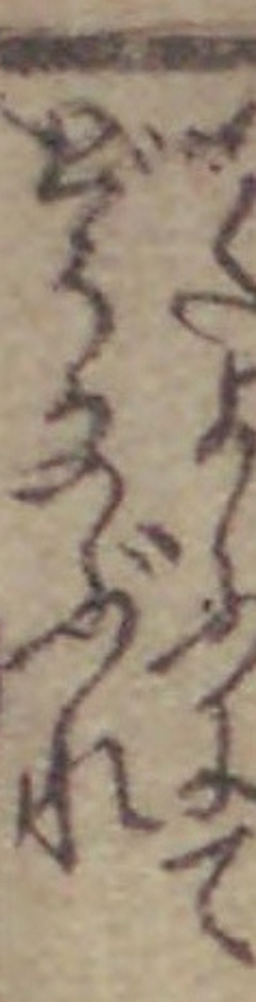どう文ぶれ
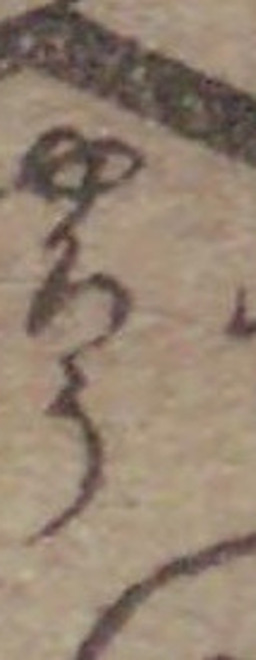やろう
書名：御代の御寶
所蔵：国立国会図書館 National Diet Library, JAPAN
